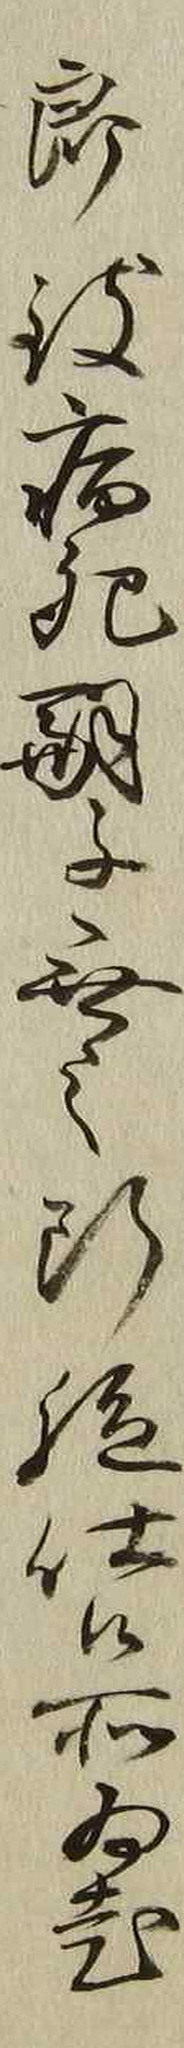郎致病死嗣子無之断絶仕候所為老
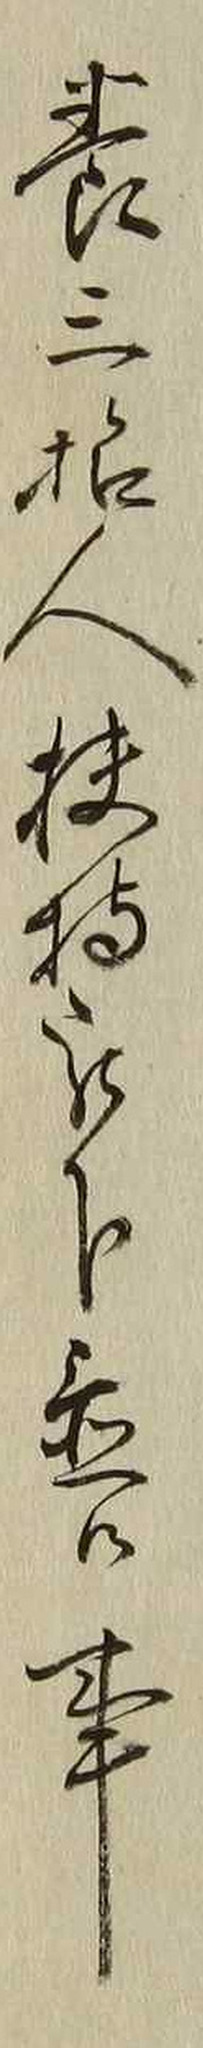養三拾人扶持被下置候事
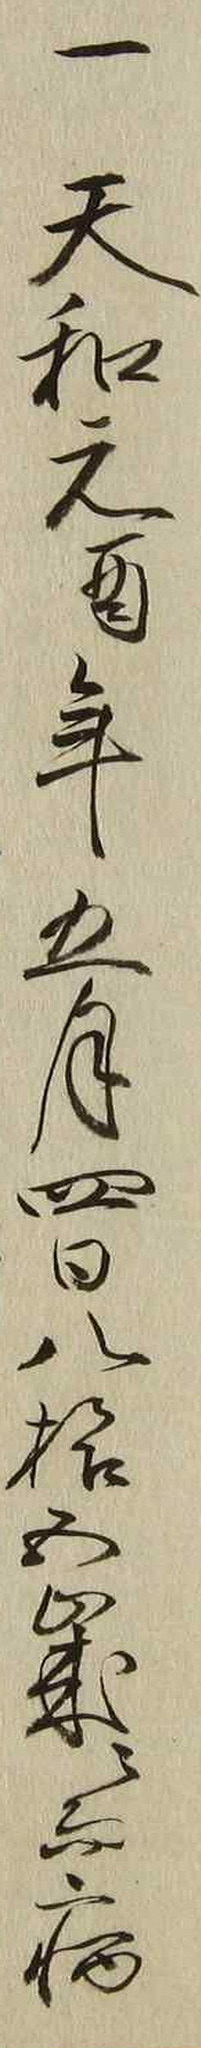一天和元酉年五月四日八拾五歳ニ而病
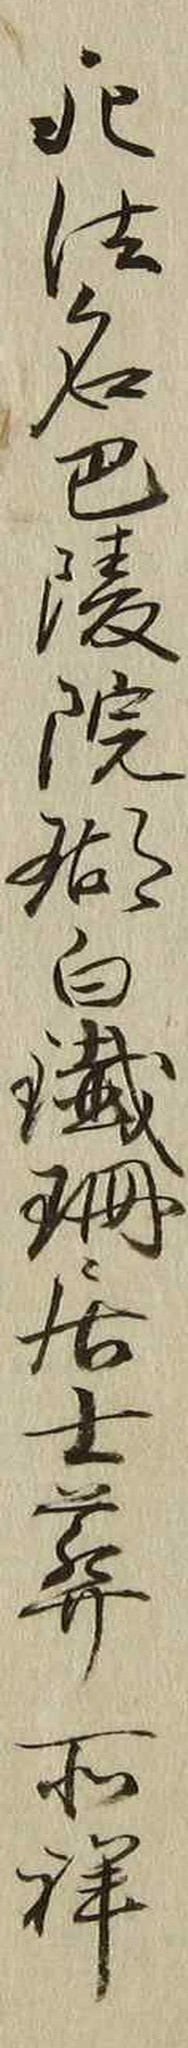死法名巴陵院瑚白鉄珊居士葬所祥
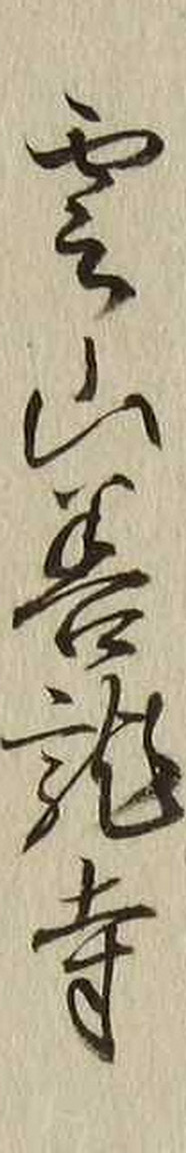雲山善龍寺
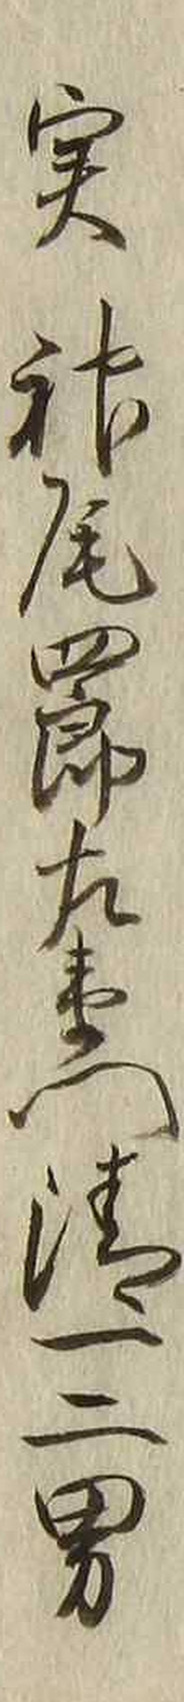実神尾四郎左衛門清一二男

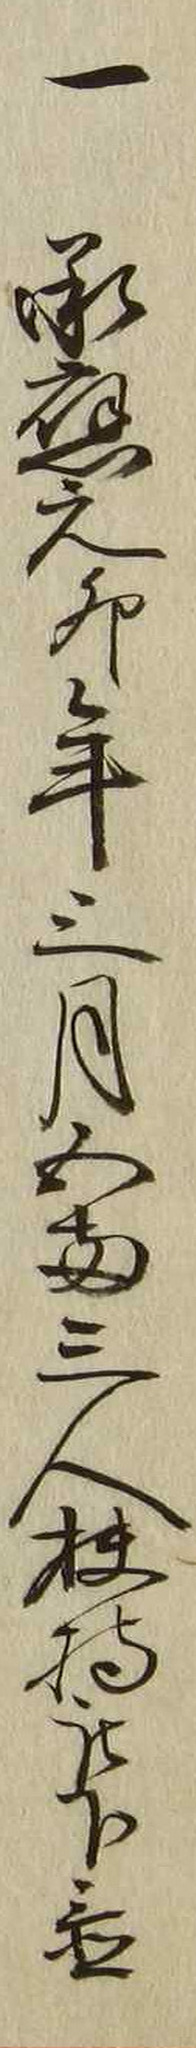一承応元卯年三月五両三人扶持被下置
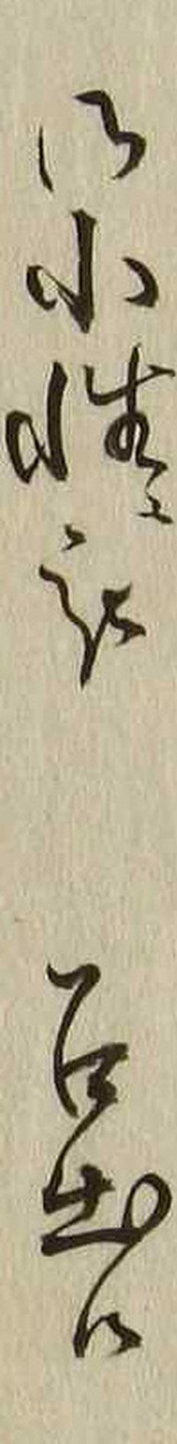御小性ニ被召出候
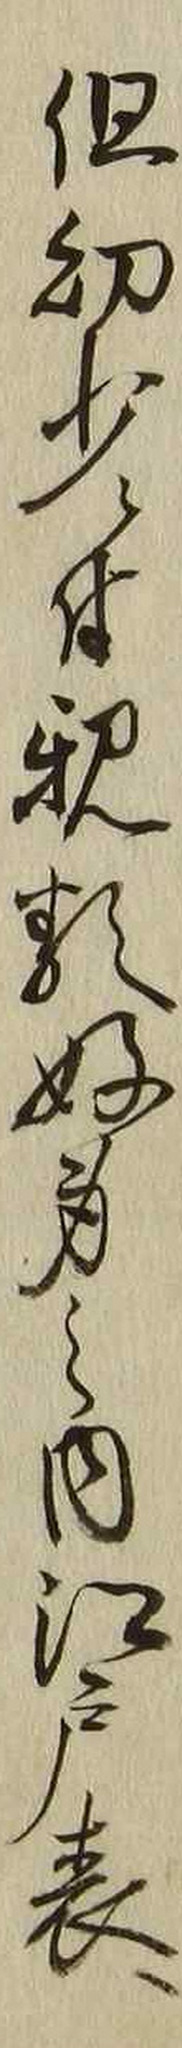但幼少ニ付親類好身之内江戸表へ
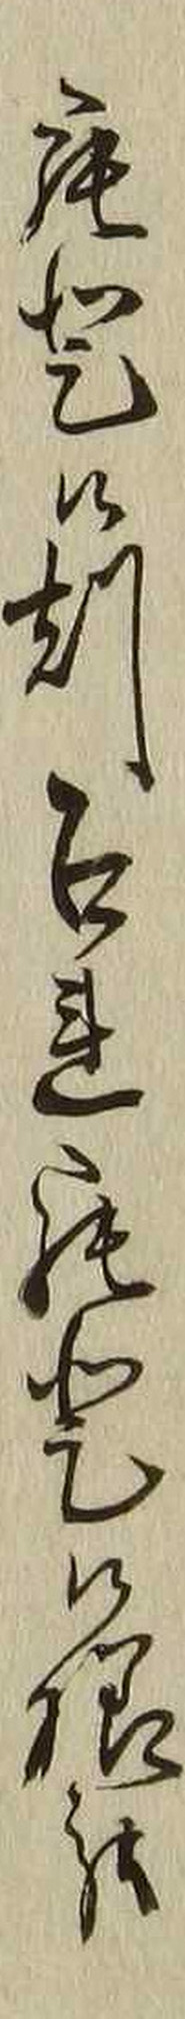罷登候刻召連罷登候様被
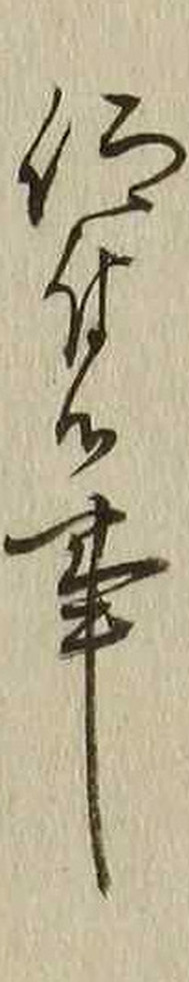仰付候事
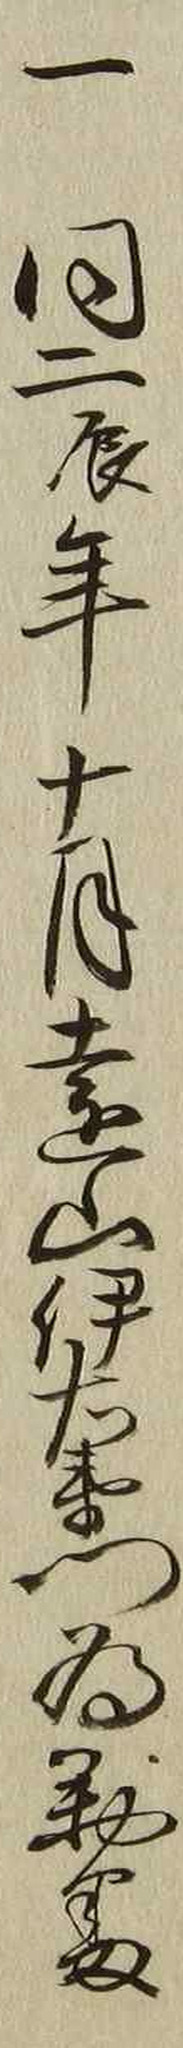一同二辰年十月達山伊右衛門為勤番
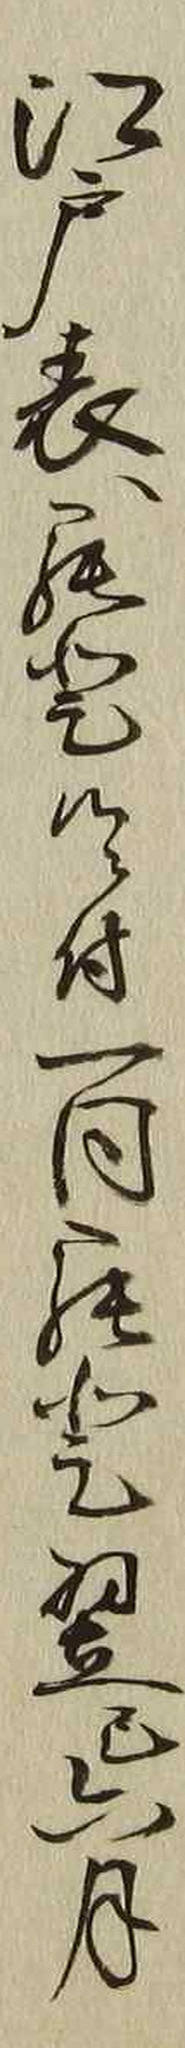江戸表へ罷登候ニ付一同罷登翌巳六月
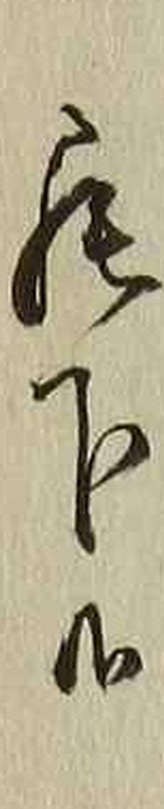罷下候
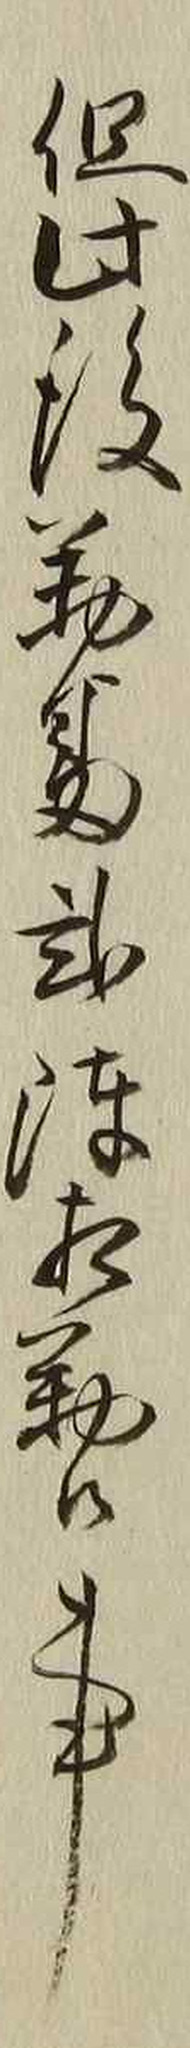但此後勤番弐陣相勤候事
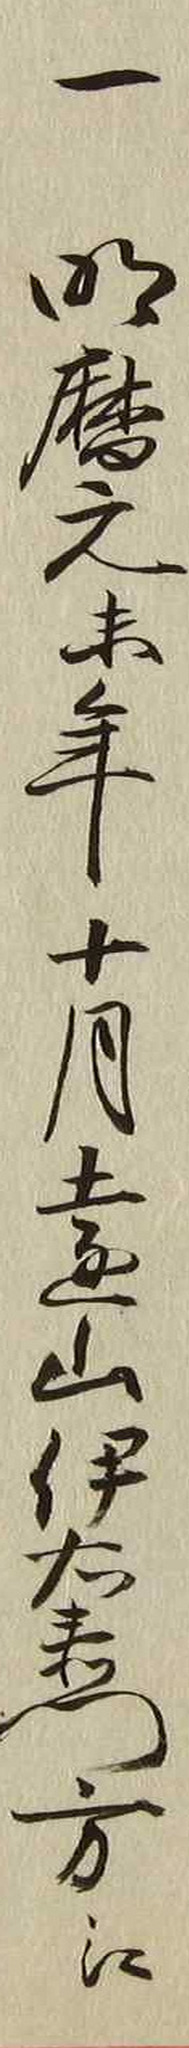一明暦元未年十月遠山伊右衛門方江
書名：諸士系譜　巻之60　と之部3
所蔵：会津若松市立会津図書館
